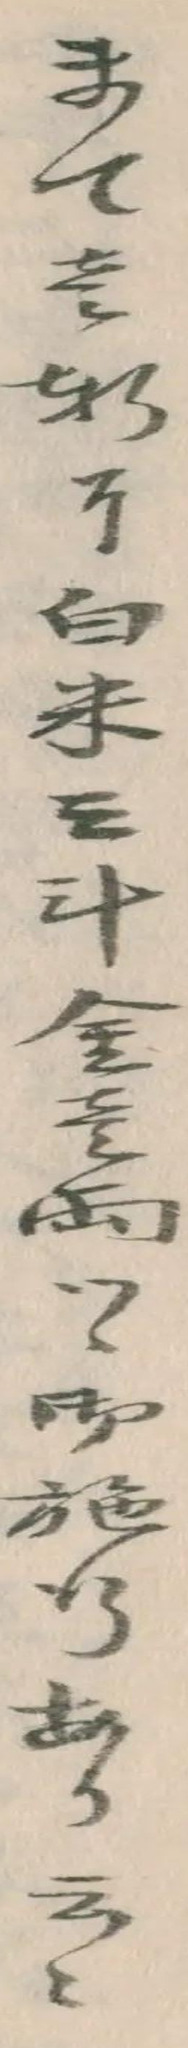まて壱軒に白米三斗金壱両つゝ御施行あり云々

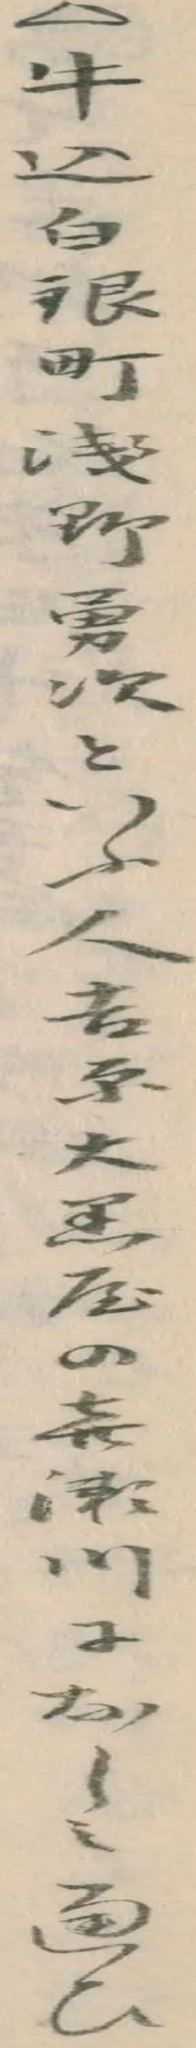△牛込白銀町浅野勇次といふ人吉原大黒屋の喜瀬川になしみ通ひ
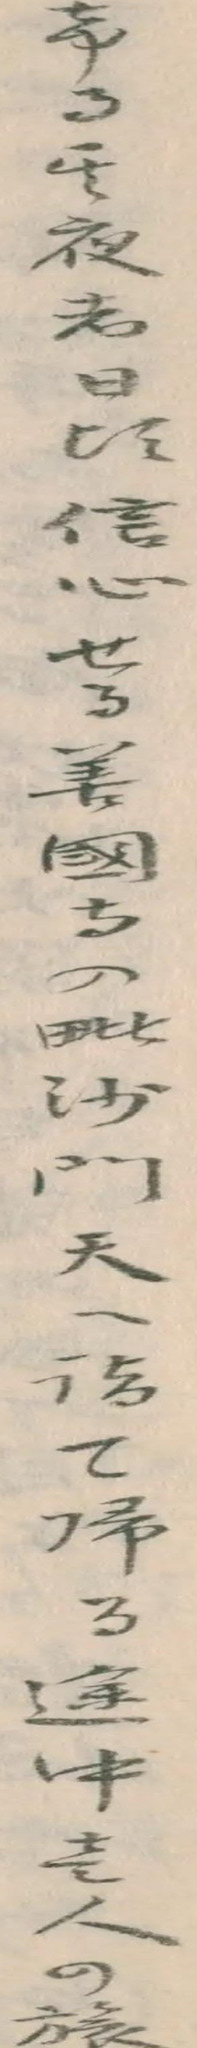ける其夜は日頃信心せる善国寺の毘沙門天へ詣て帰る途中壱人の旅
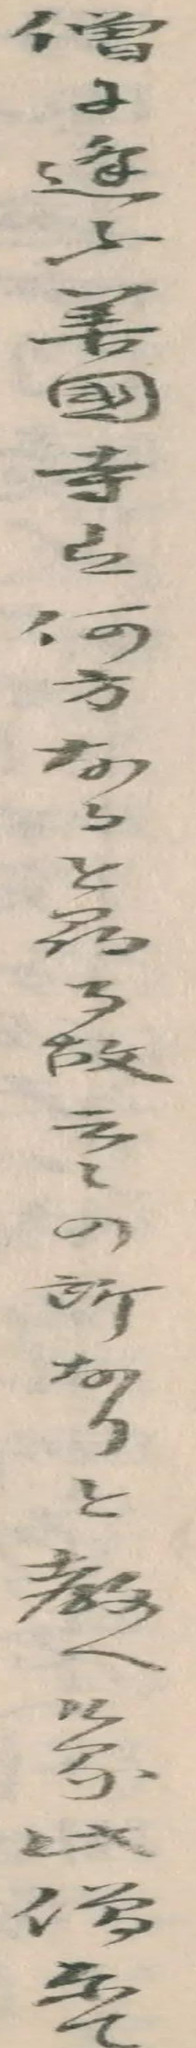僧に逢ふ善国寺は何方なると尋る故云々の所なりと教へける此僧示て
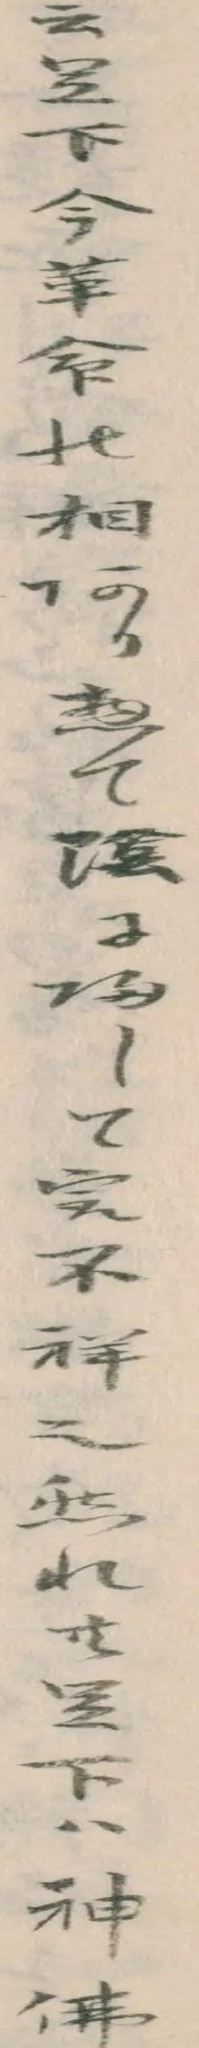云足下今革命の相あり惣て陰に帰して最不祥也然れ共足下は神仏
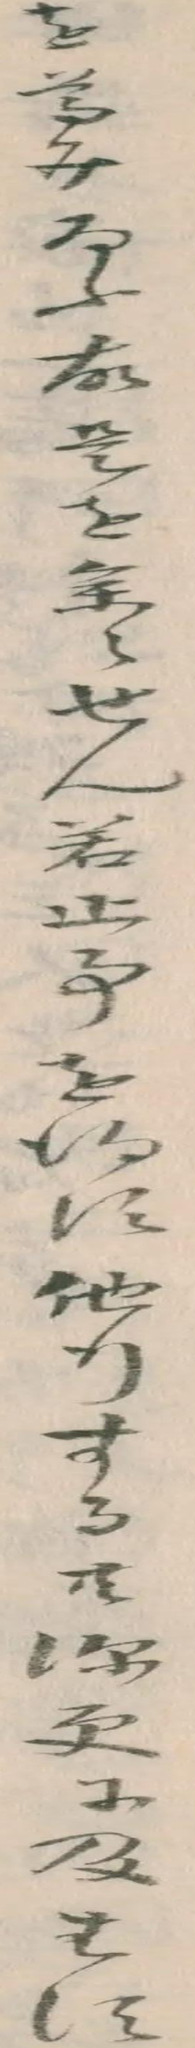を尊み給ふ故是を参らせん若止事を得す他行する共深更に及はす
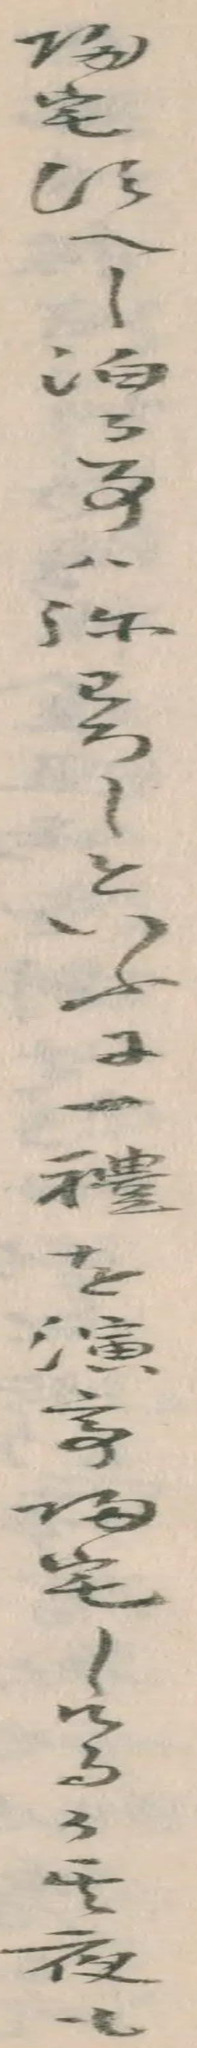帰宅すへし泊る事は弥わろしといふに一礼を演て帰宅しけるか其夜も
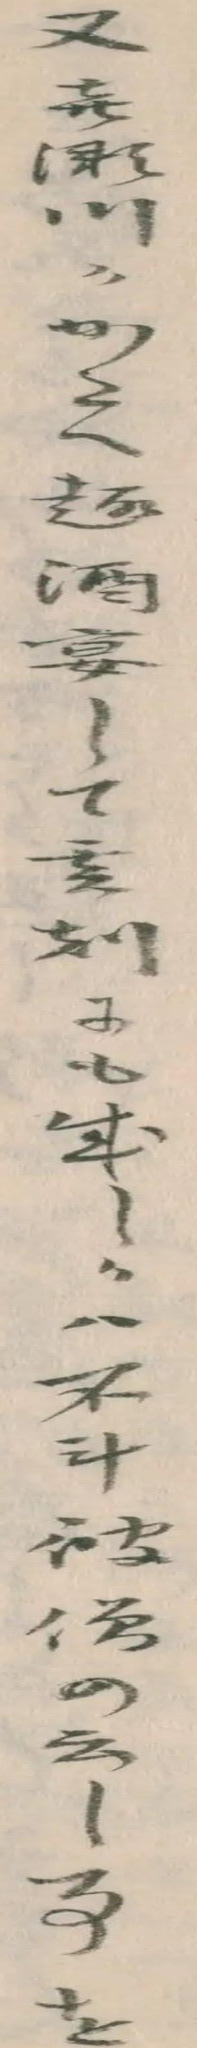又喜瀬川かかたへ趣酒宴して亥刻にも成しかは不斗彼僧の云し事を
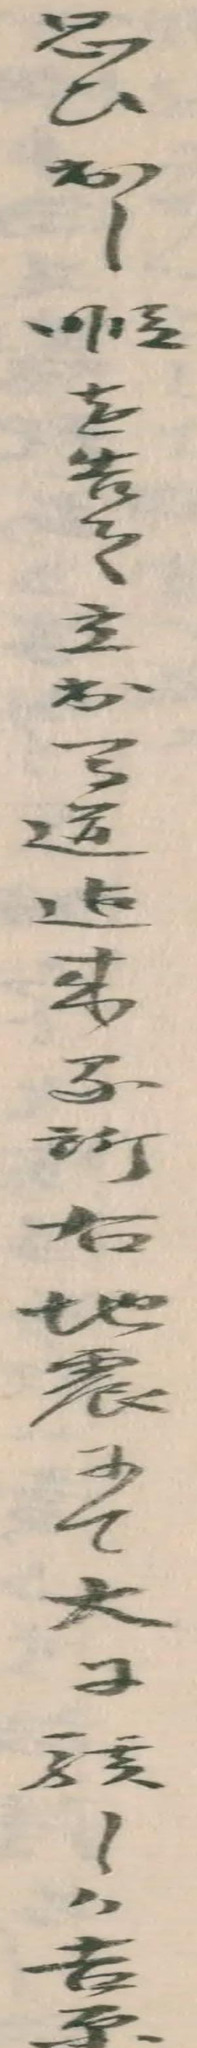思ひ出し暇を告て立出馬道迄来る所右地震にて大に駭しか吉原
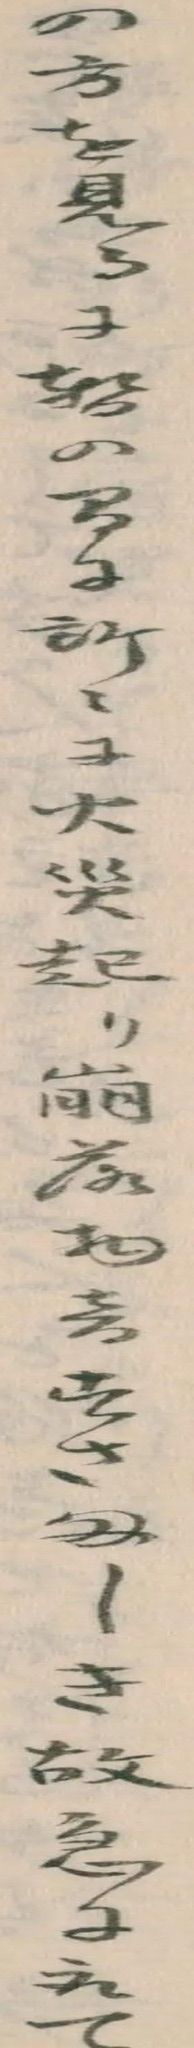の方を見るに暫の間に所々に火災起り崩落物音すさましき故急に取て
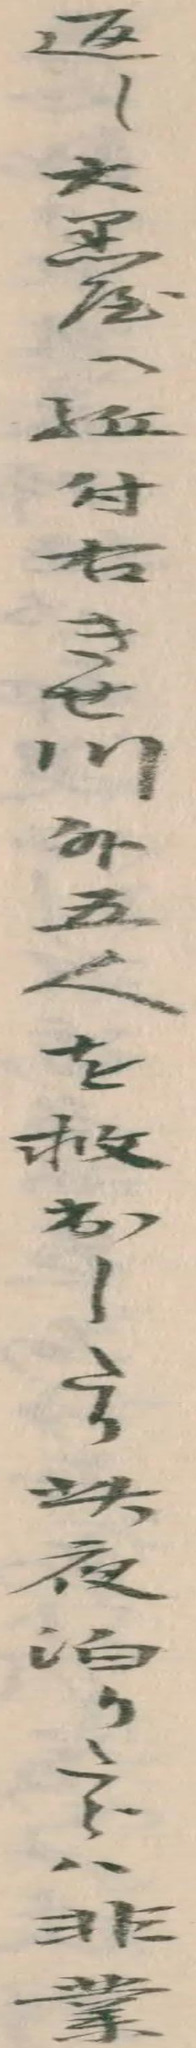返し大黒屋へ駈付右きせ川外五人を救出したり此夜泊りたらは非業
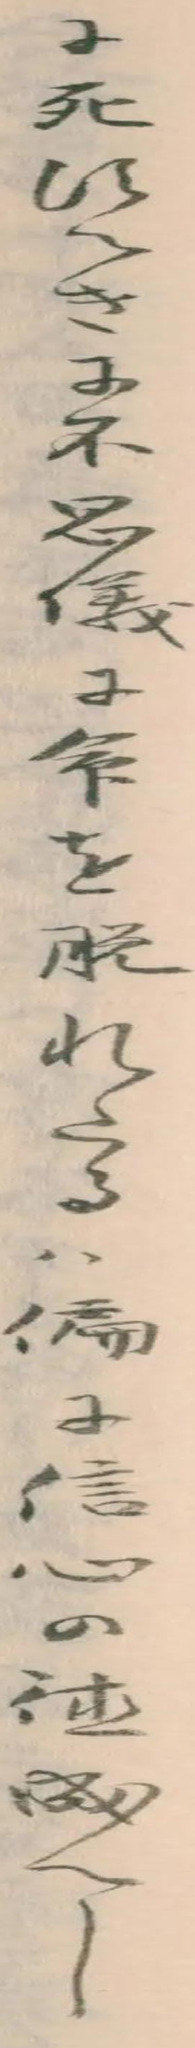に死すへきに不思議に命を脱れたるは偏に信心の徳成へし
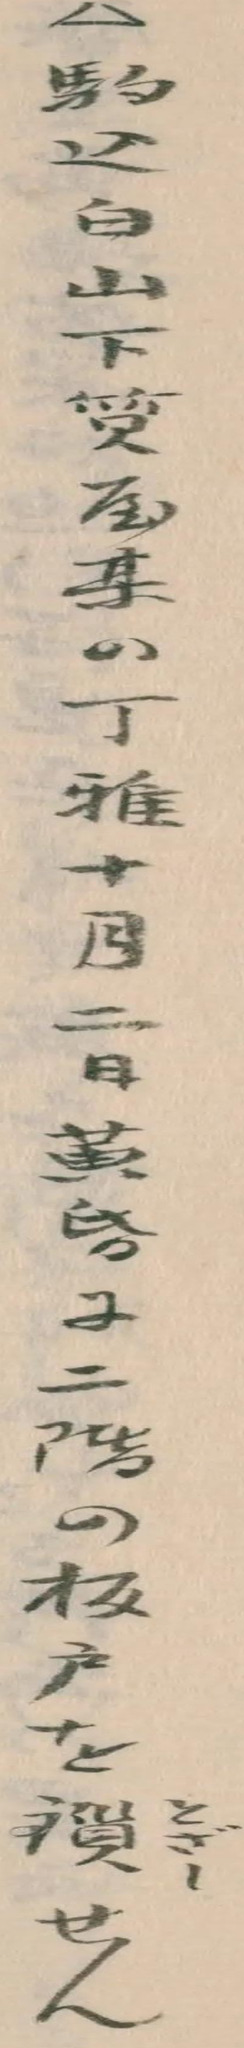△駒込白山下質屋某の丁稚十月二日黄昏に二階の板戸を鎖せん
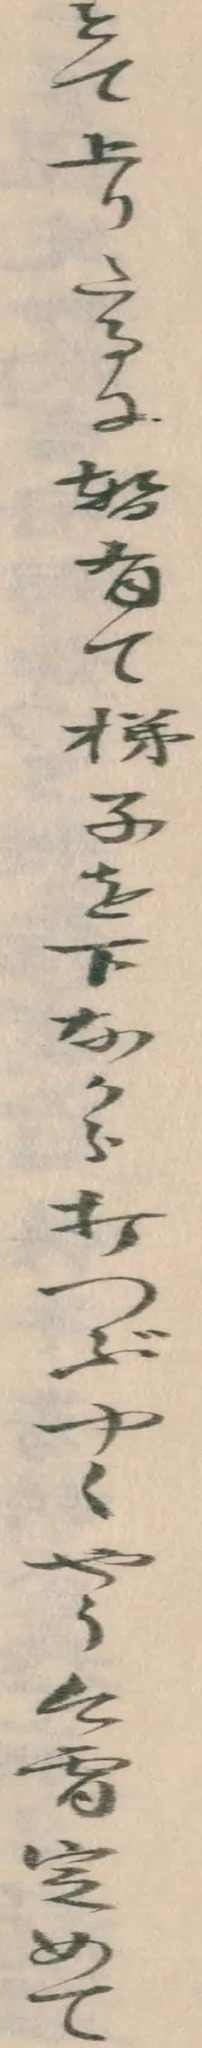とて上りたるに暫有て梯子を下なから打つぶやくやう今宵定めて
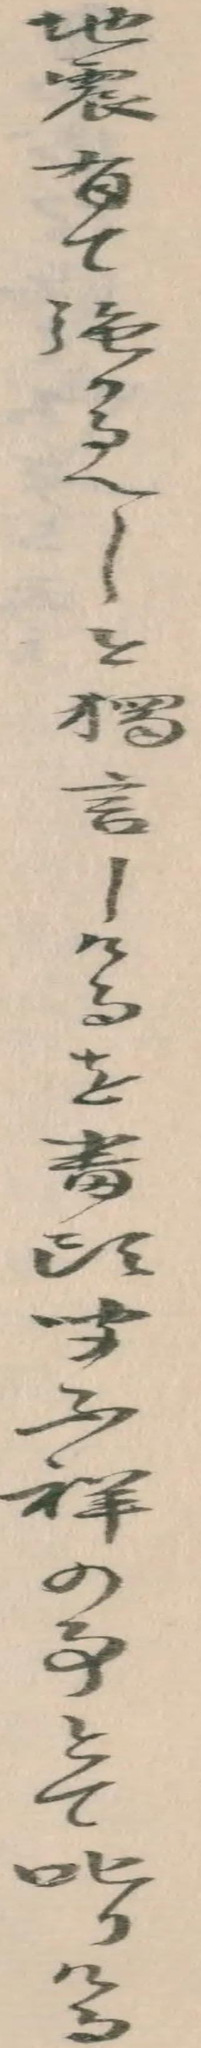地震有て強かるへしと独言しけるを番頭聞不祥の事とて叱りける
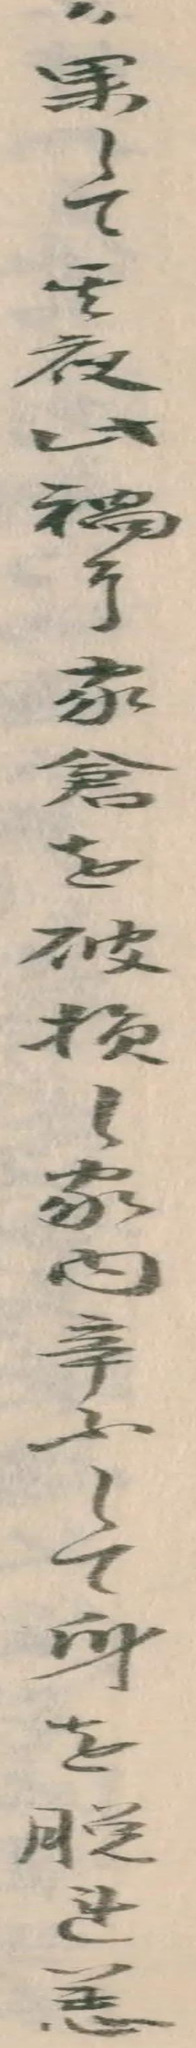か果して其夜此禍に家倉を破損し家内辛ふして身を脱れ恙
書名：地災撮要. 巻10(地震之部) 上,下
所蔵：国立国会図書館 National Diet Library, JAPAN
